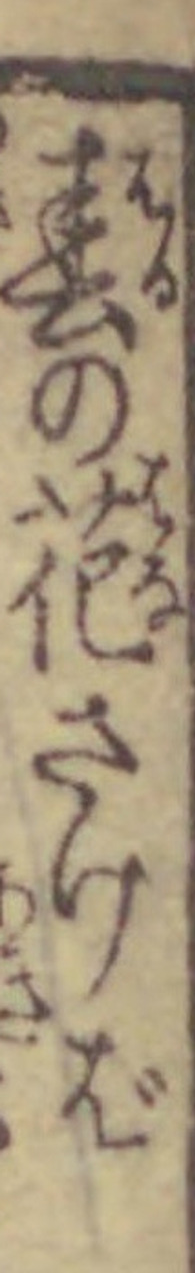春の花さけば
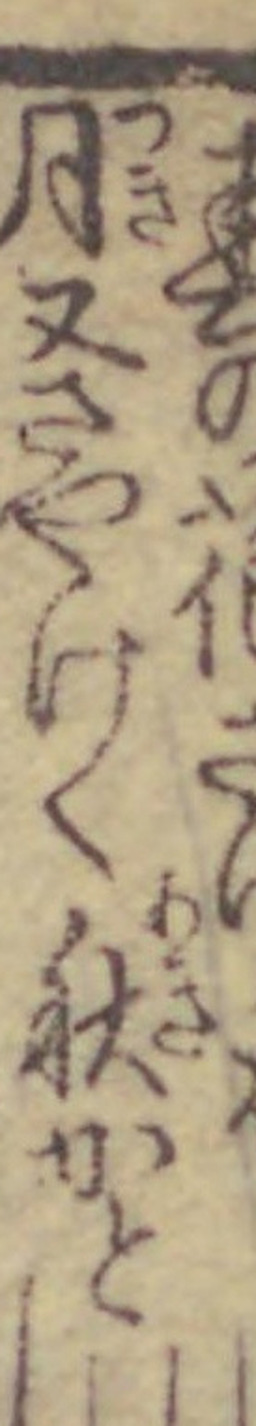月又さやけく秋かと
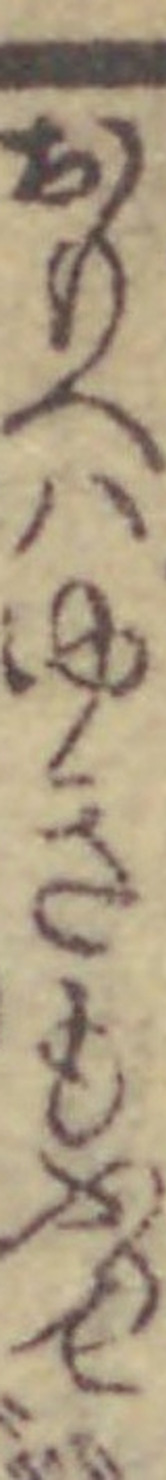おもへはゆきもふりて
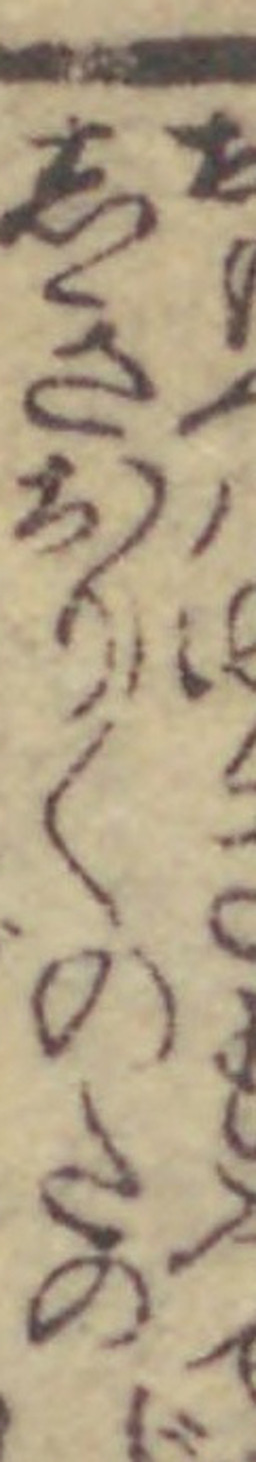しきおり〳〵のたの
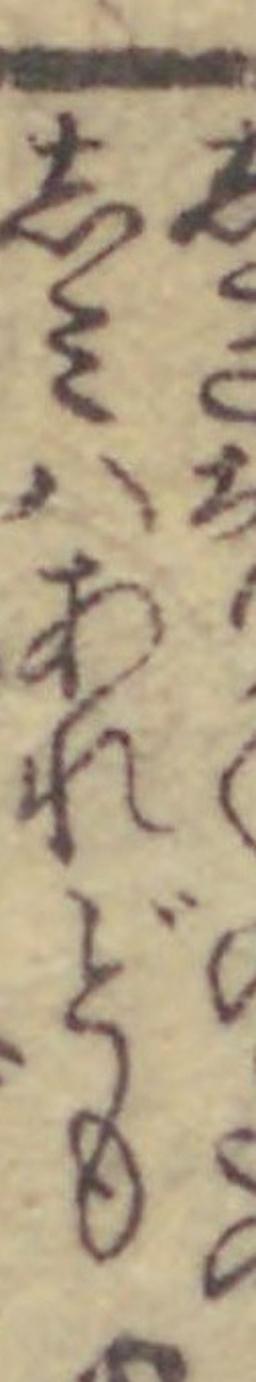しみはあれども
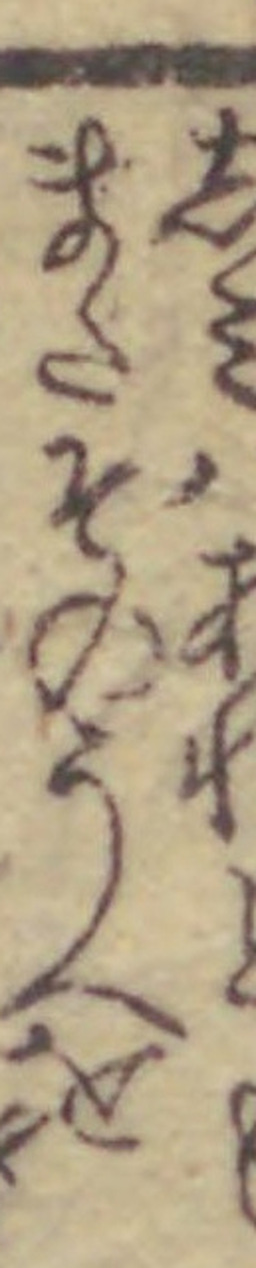またそのうへを
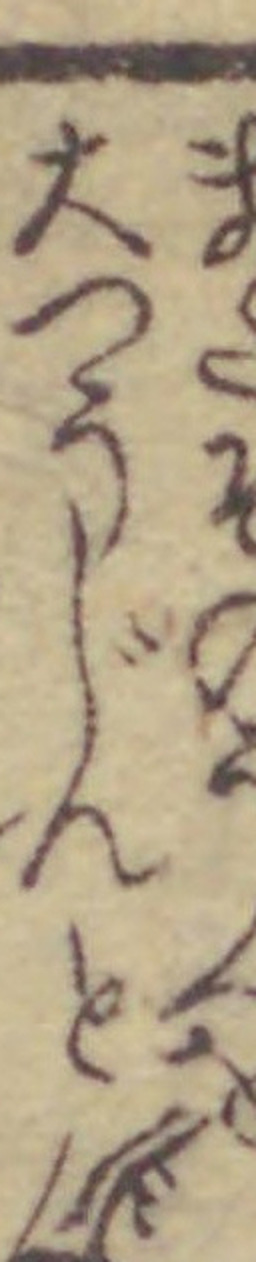大つうじんと
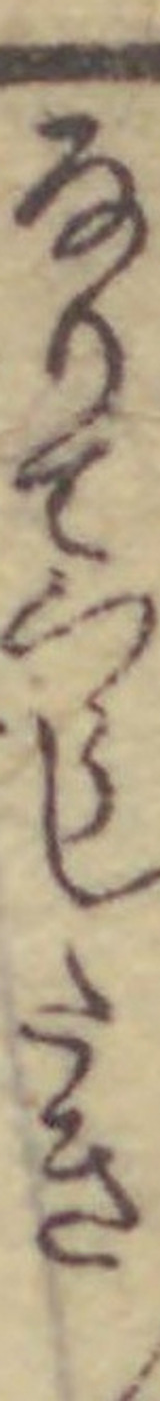なりてくらしたき
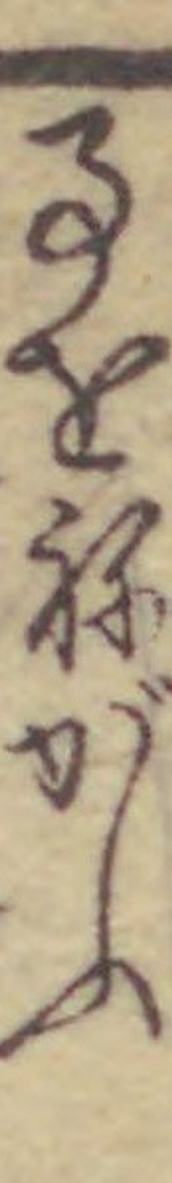事をねがふ
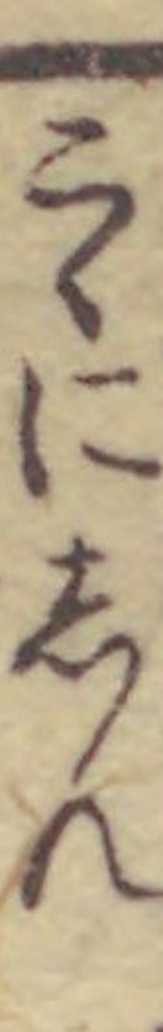こゝにしん
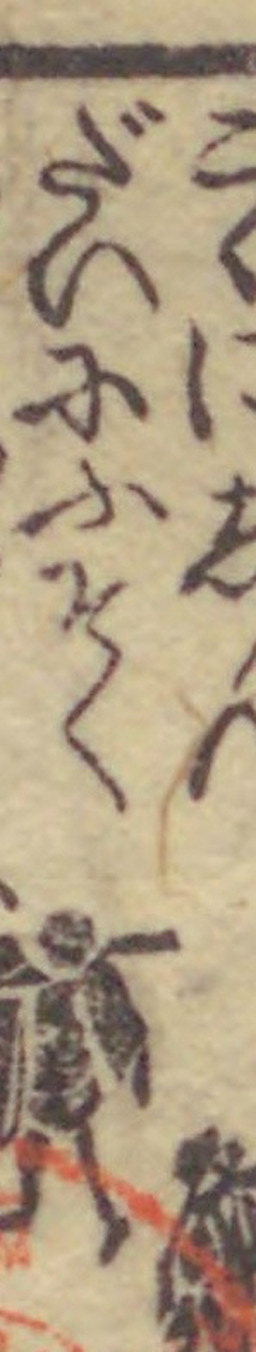だいにふそく
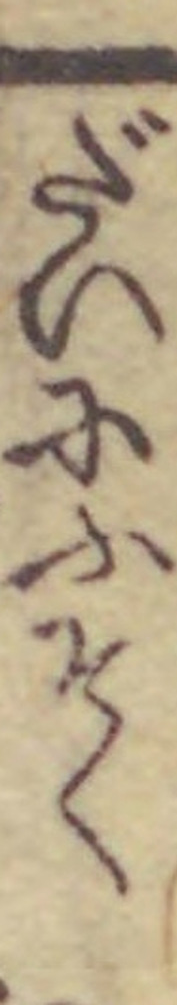だいにふそく
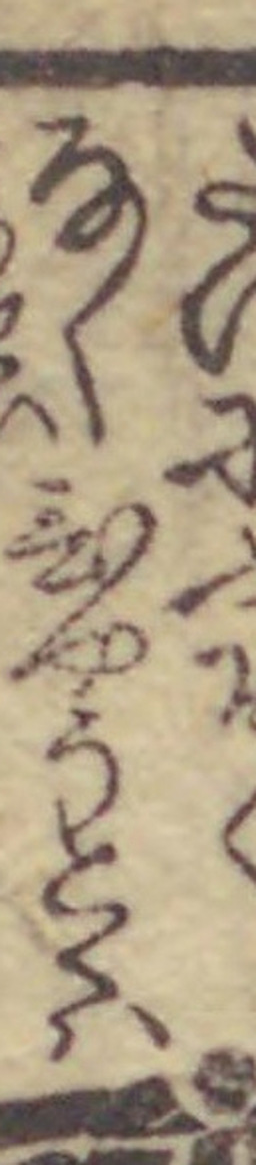なくひやうとくは
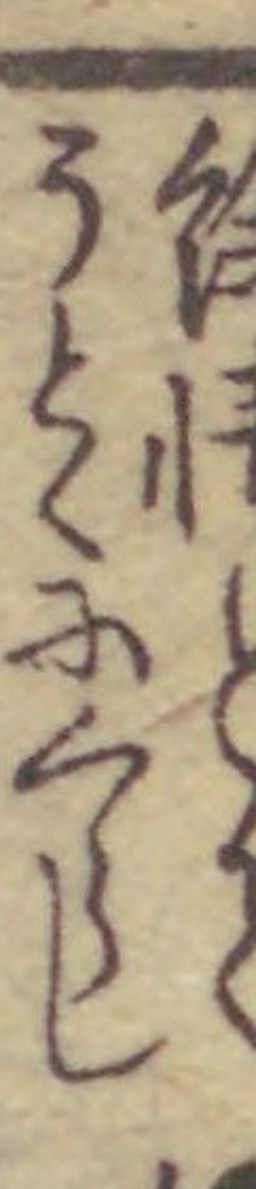うとくにくらし
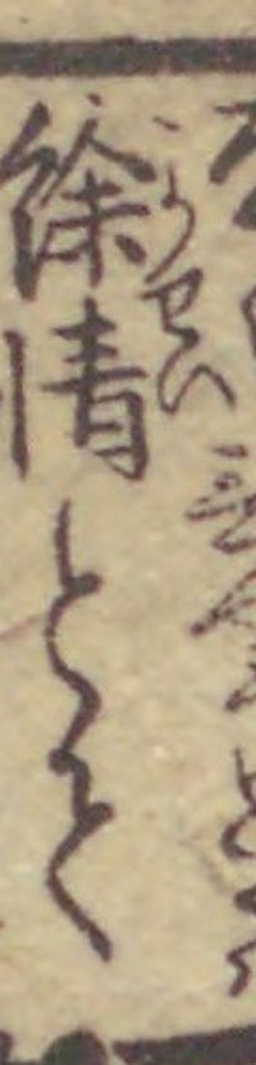余情とて
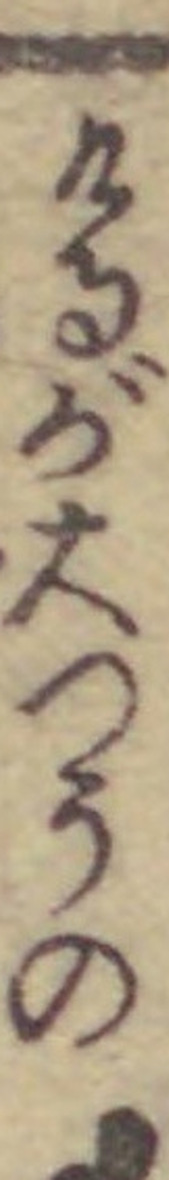けるが大つうの
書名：大通人穴[サガシ] 3巻
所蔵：国立国会図書館 National Diet Library, JAPAN
